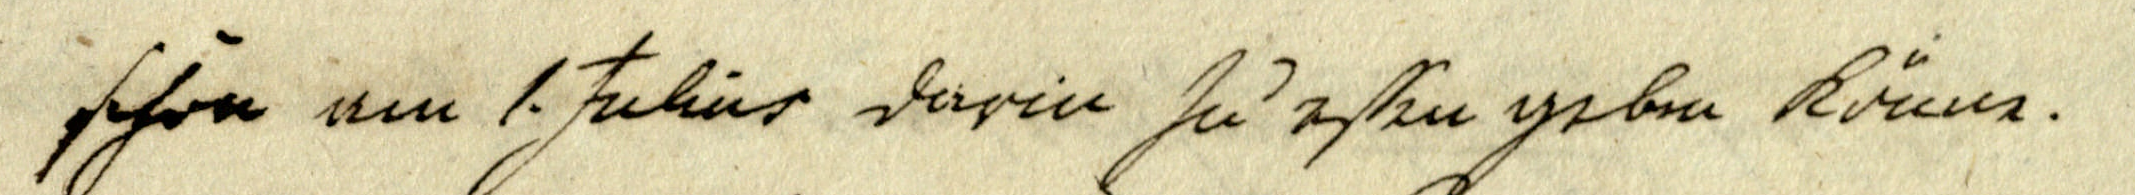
schon am 1. Julius darin zu essen geben könne.
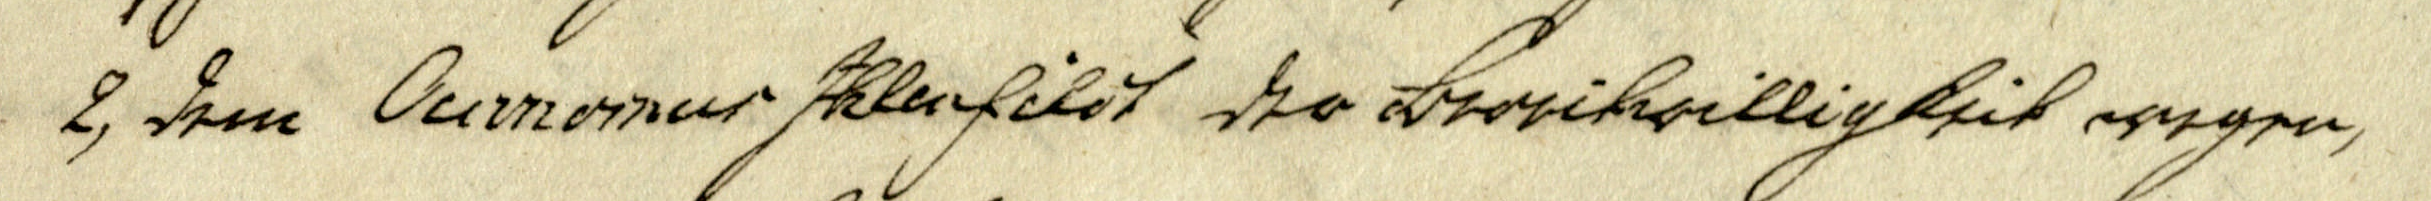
2, dem Oeconomus Ihlenfeldt der Bereitwilligkeit wegen,
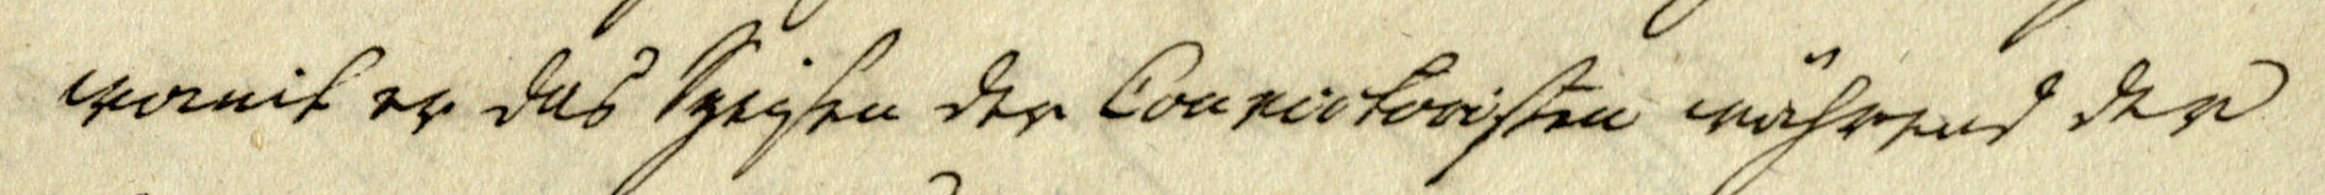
womit er das Speisen der Convictoristen während der
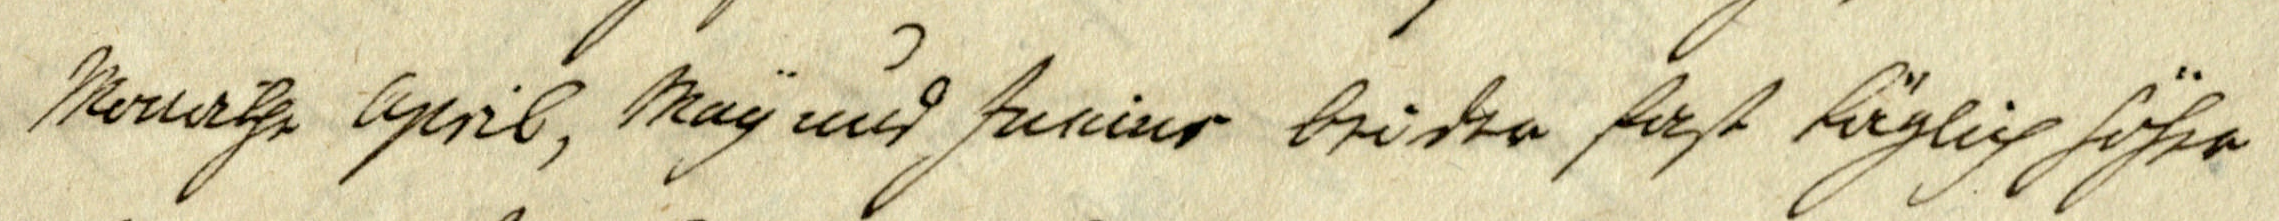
Monathe April, Maÿ und Junius bei der fast täglich höher
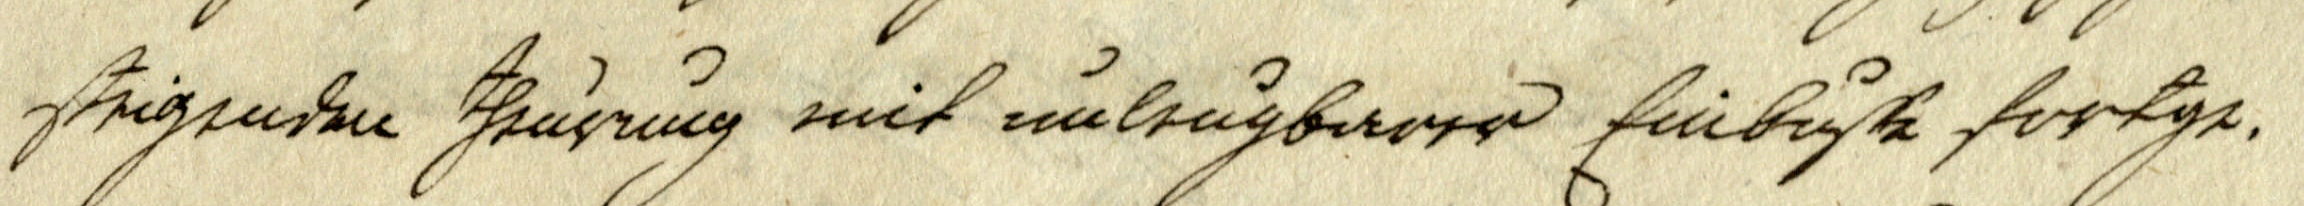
steigenden Theurung mit unleugbarer Einbusse fortge¬
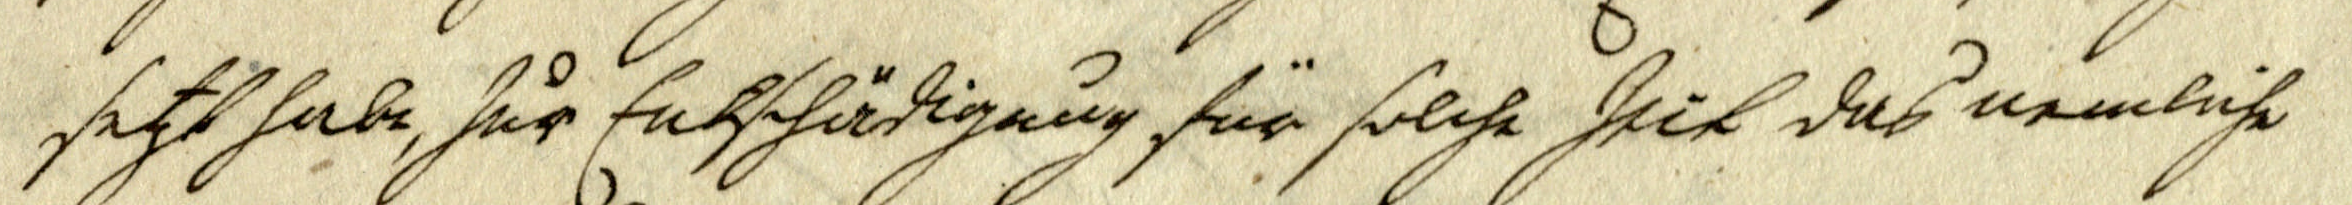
setzt habe, zur Entschädigung für solche Zeit das nemliche
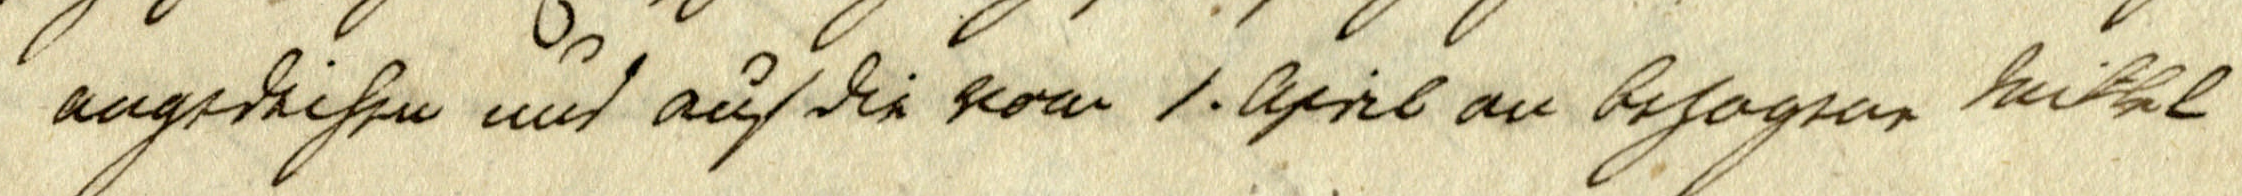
angedeihen und auf die vom 1. April an bezogenen Mittel
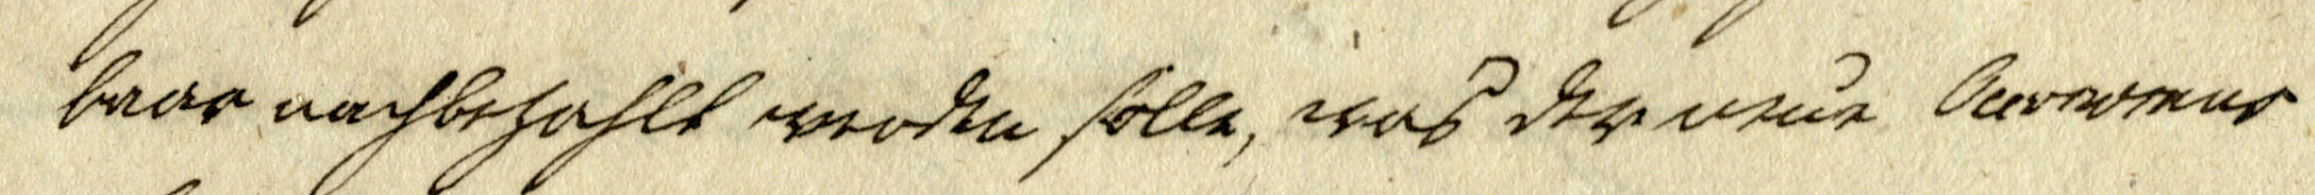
baar nachbezahlt werden solle, was der neue Oeconomus
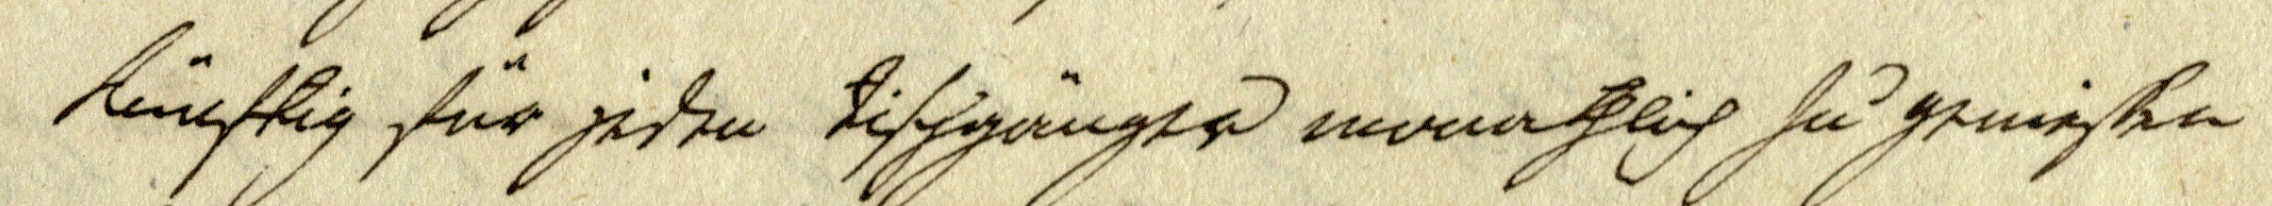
künftig für jeden Tischgänger monathlich zu geniessen
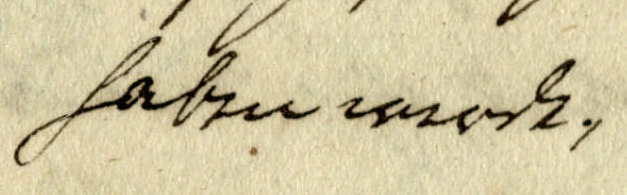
haben werde,
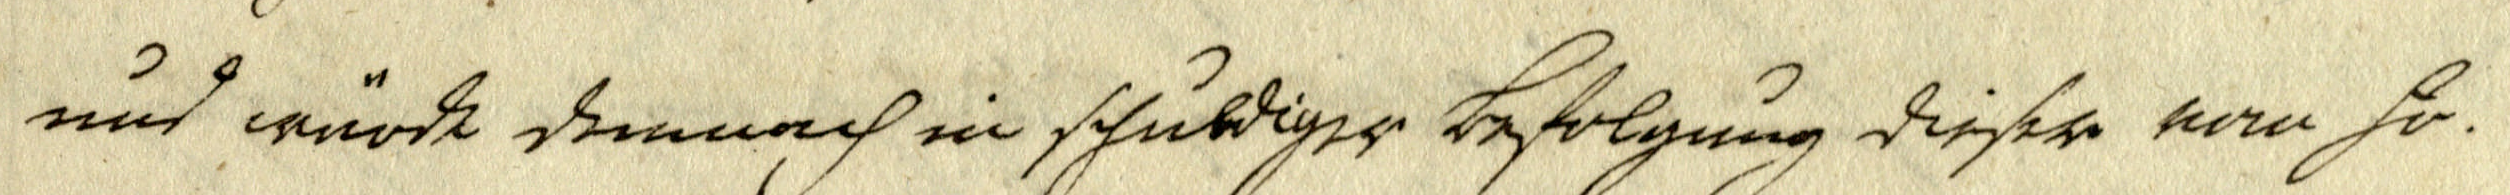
und würde demnach in schuldiger Befolgung dieser vom ho¬
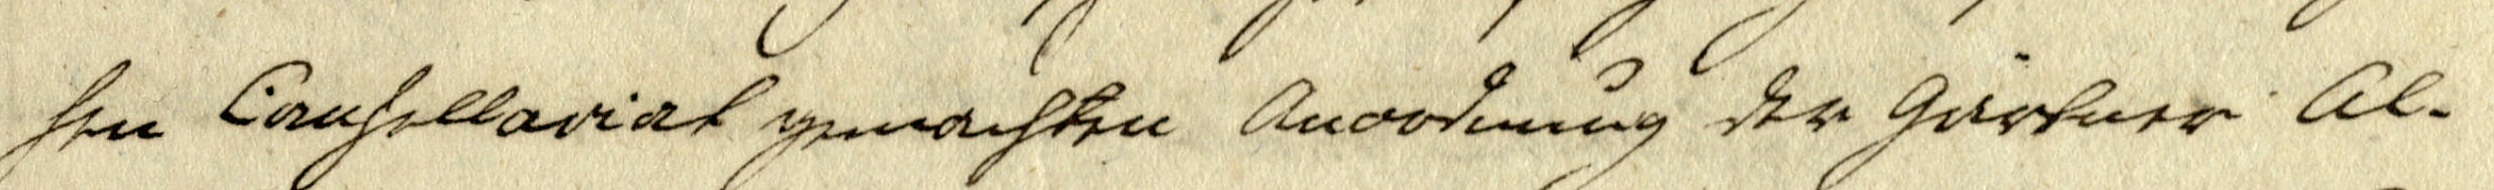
hen Canzellariat gemachten Anordnung der Gärtner Al¬
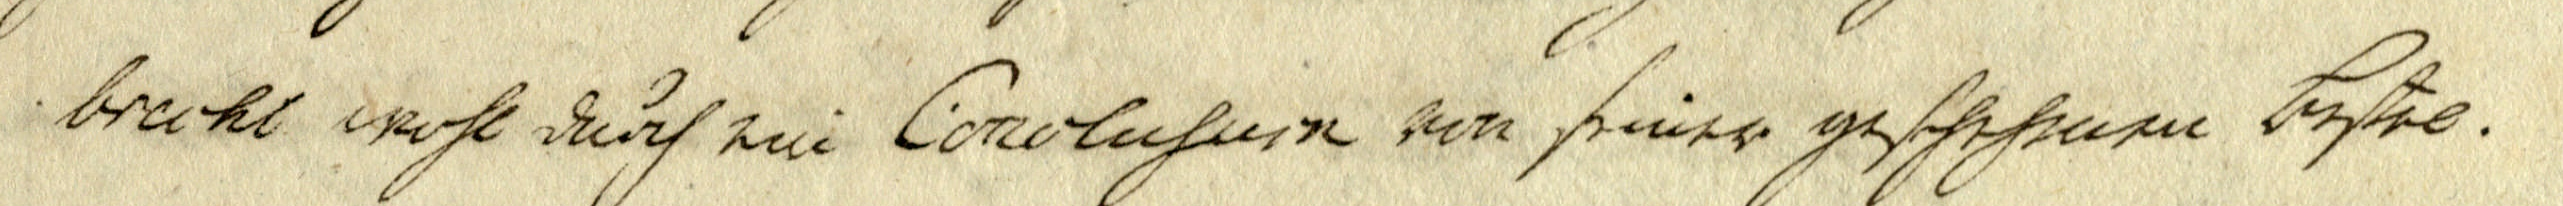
brecht wohl durch ein Conclusum von seiner geschehenen Bestel¬
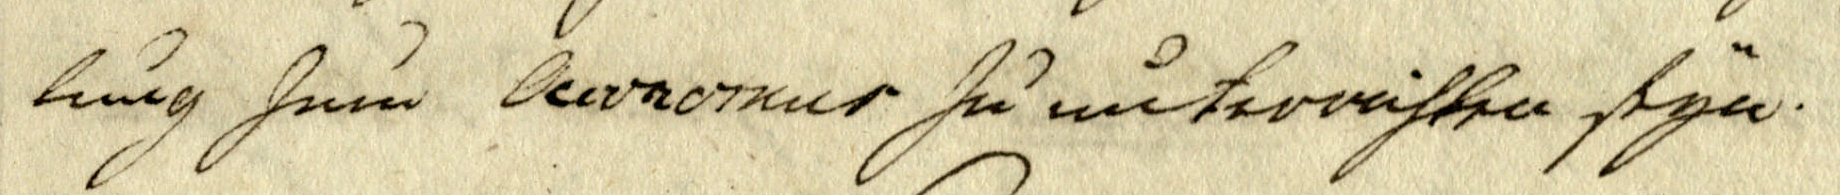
lung zum Oeconomus zu unterrichten seÿn.
